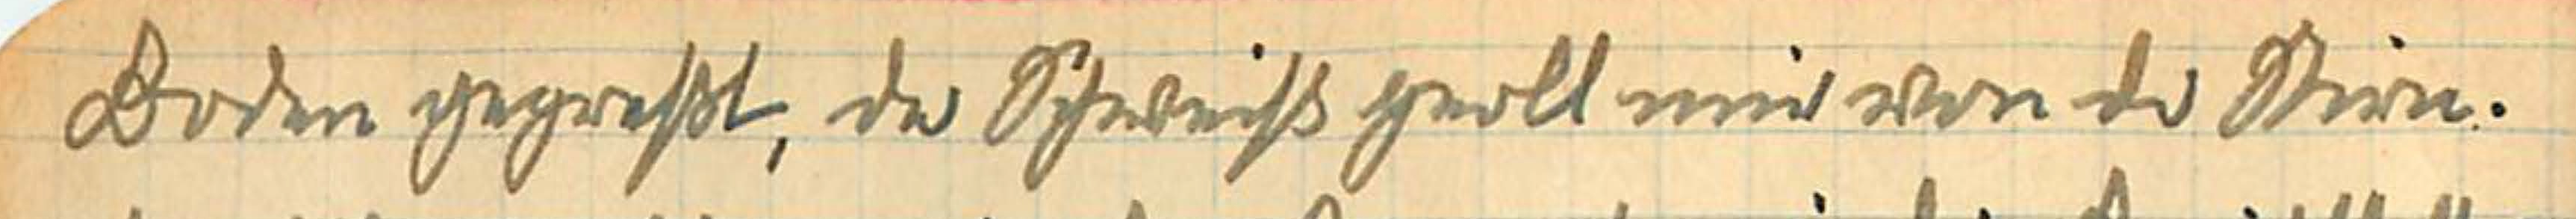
Boden gepreßt, der Schweiß perlt mir von der Stirn.
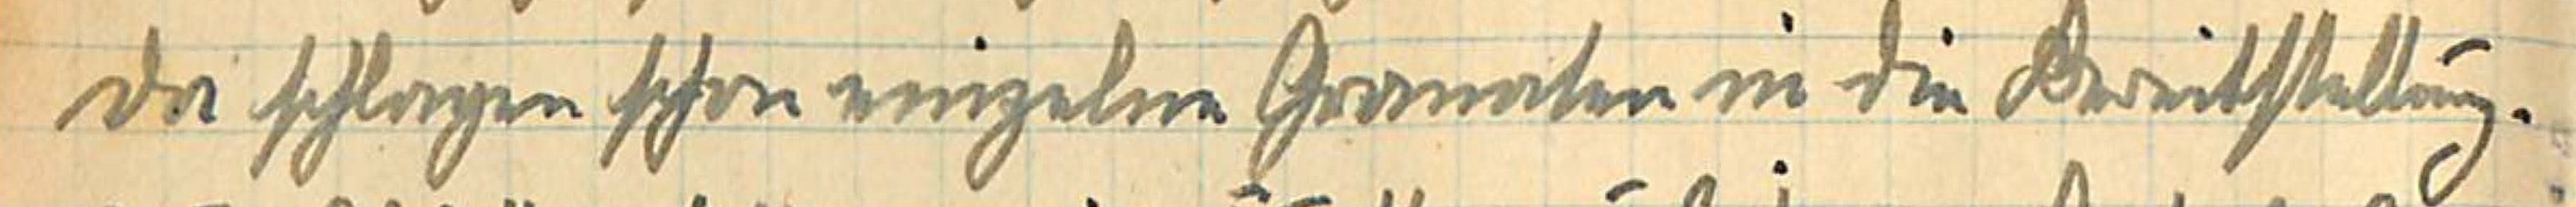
Da schlagen schon einzelne Granaten in die Bereitstellung.
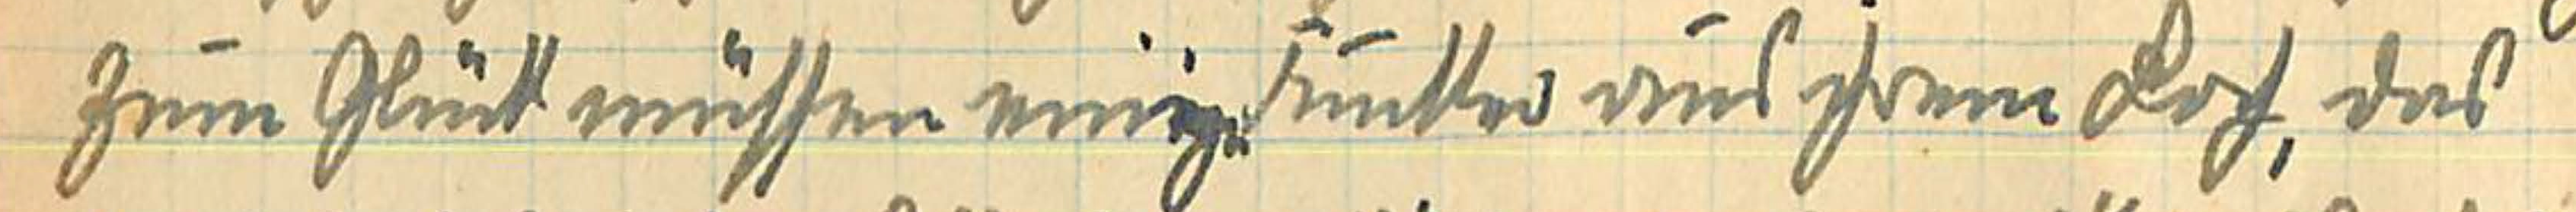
Zum Glück müssen einige Funker aus ihrem Loch, das
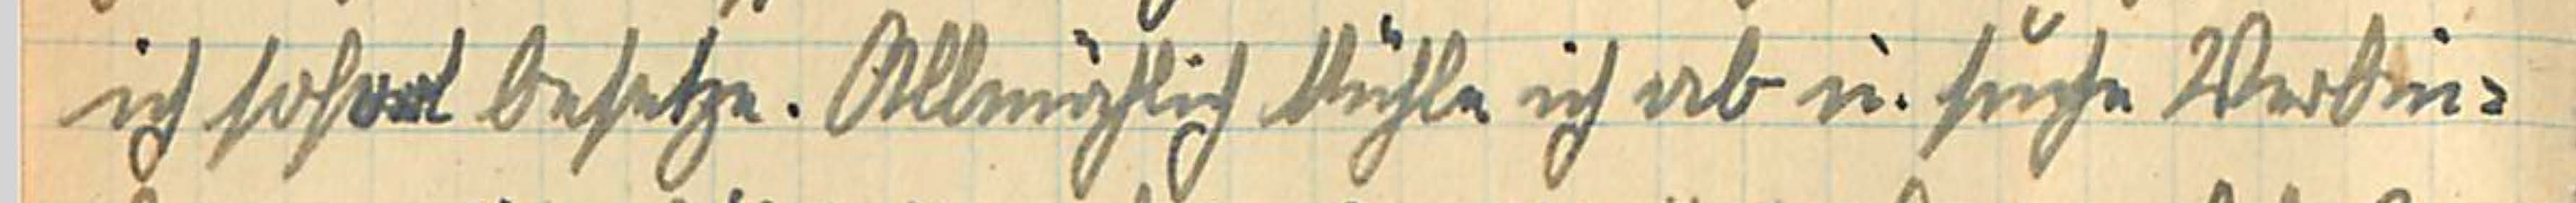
ich sofort besetze. Allmählich kühle ich ab u. suche Verbin-
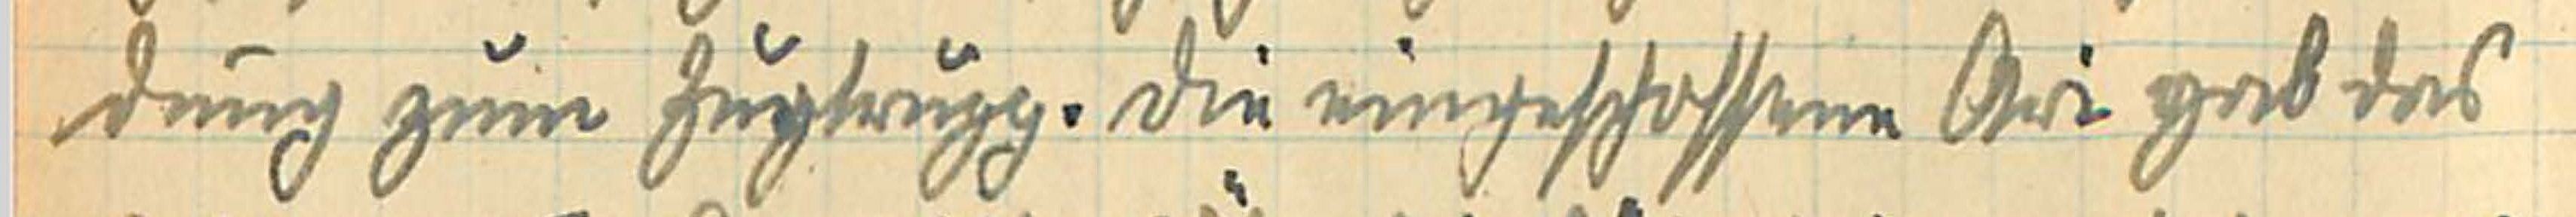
dung zum Zugtrupp. Die eingeschossene Ari gab das
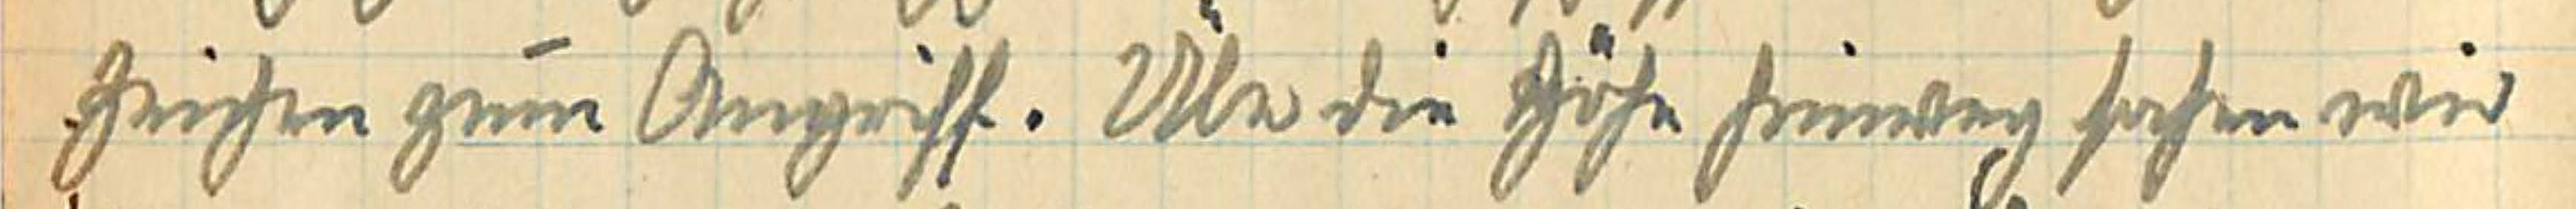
Zeichen zum Angriff. Über die Höhe hinweg sahen wir
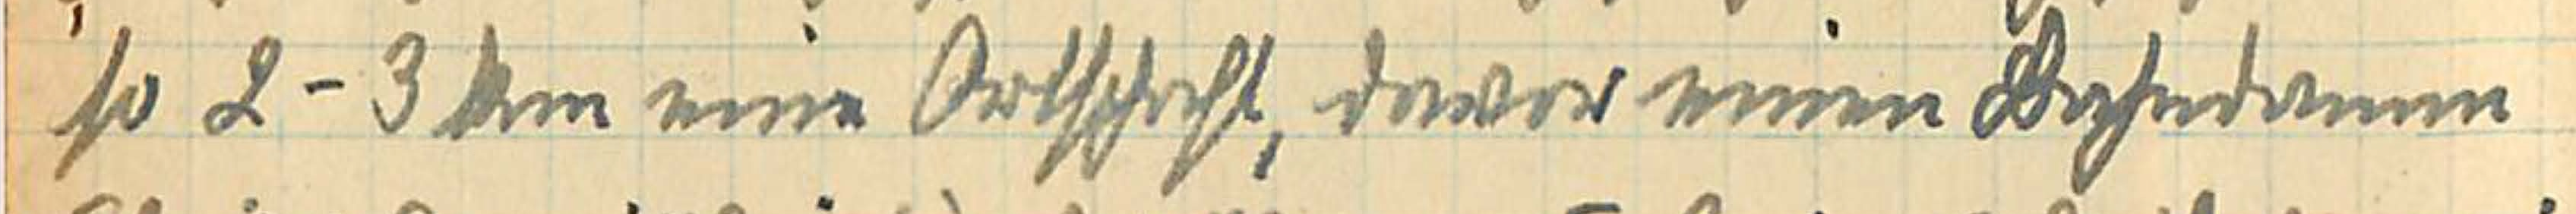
so 2-3 km eine Ortschaft, davor einen Bahndamm
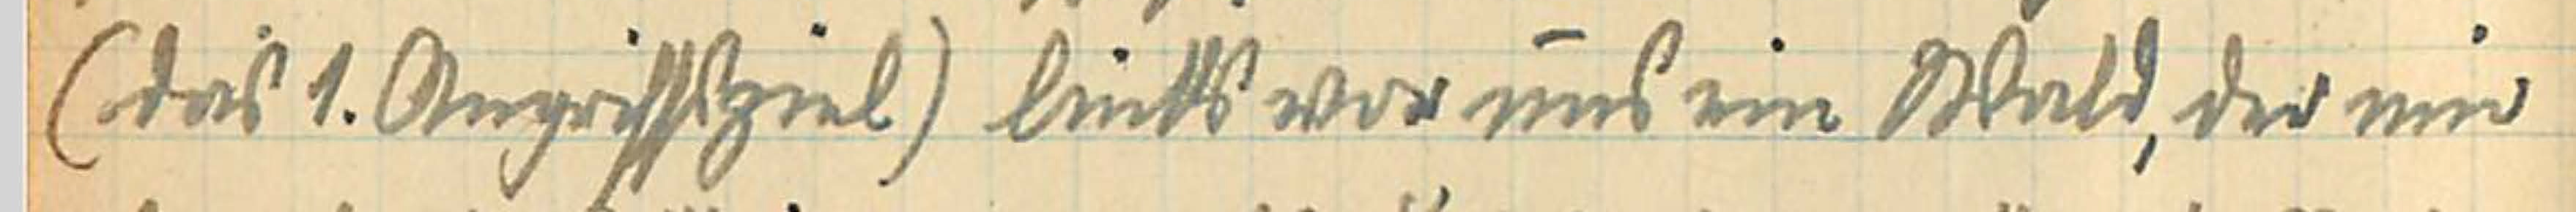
(das 1. Angriffsziel) links vor uns ein Wald, der mir
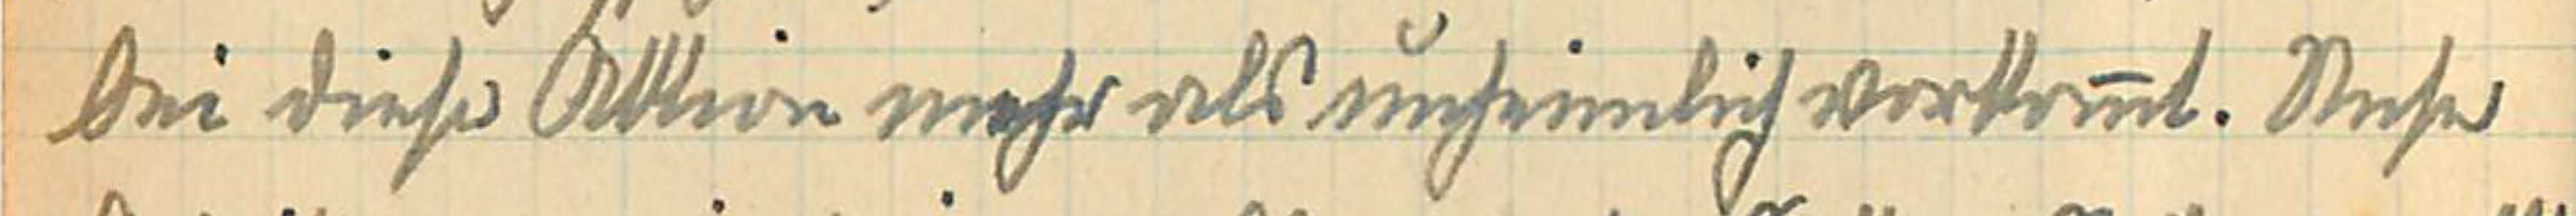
bei dieser Aktion mehr als unheimlich vorkommt. Unser
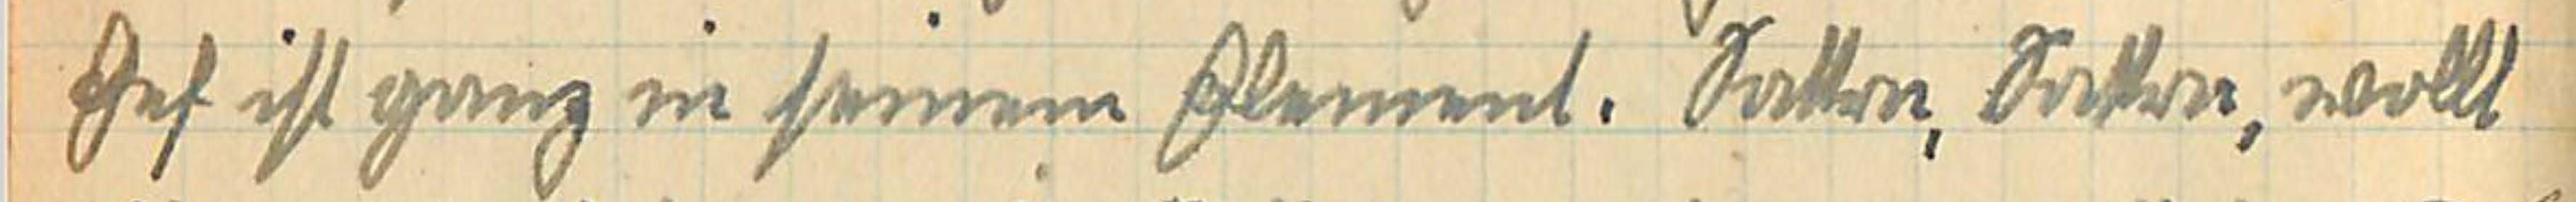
Chef ist ganz in seinem Element. Sakra, Sakra, wollt
